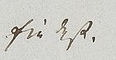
findest.
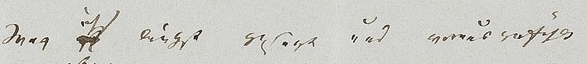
Was ich längst gesagt und vorausgefühlt
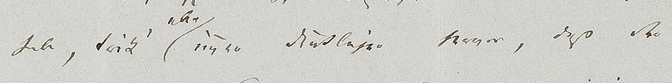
habe, tritt´ eben immer deutlicher hervor, daß der
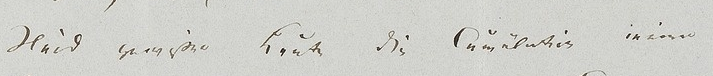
Neid gewißer Leute die Cumulation meiner
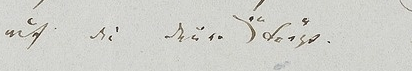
auf die Dauer erträgt.
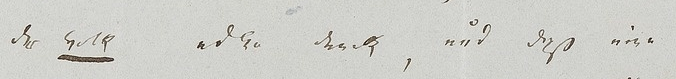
das Volk edler denckt, und daß eine
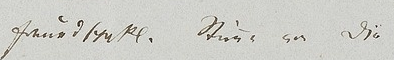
freundschaftl. Stimme von Dir in
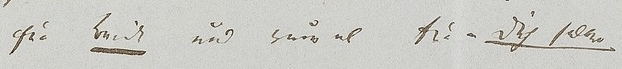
für Beide und zumal für Dich selber
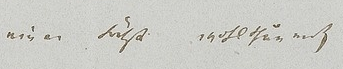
einen höchst wohlthuenden
